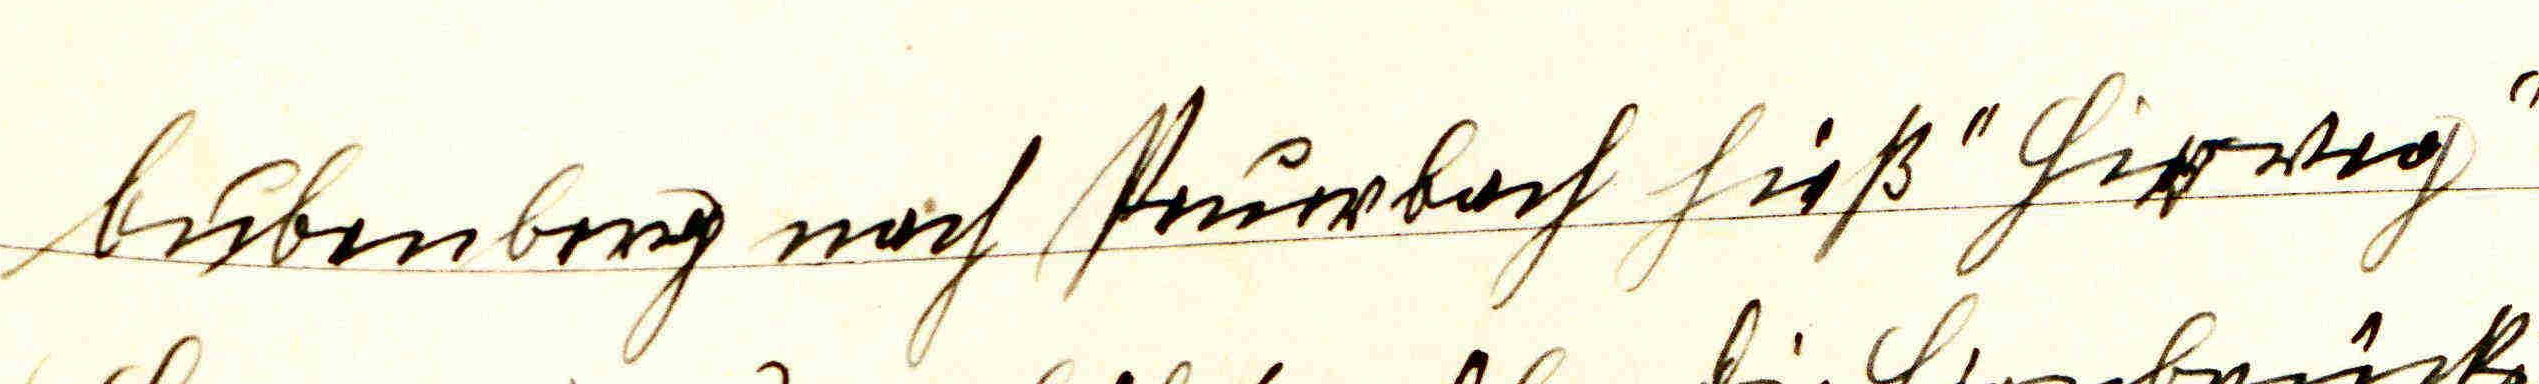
bubenberg nach Peuerbach hieß „Hirweg“
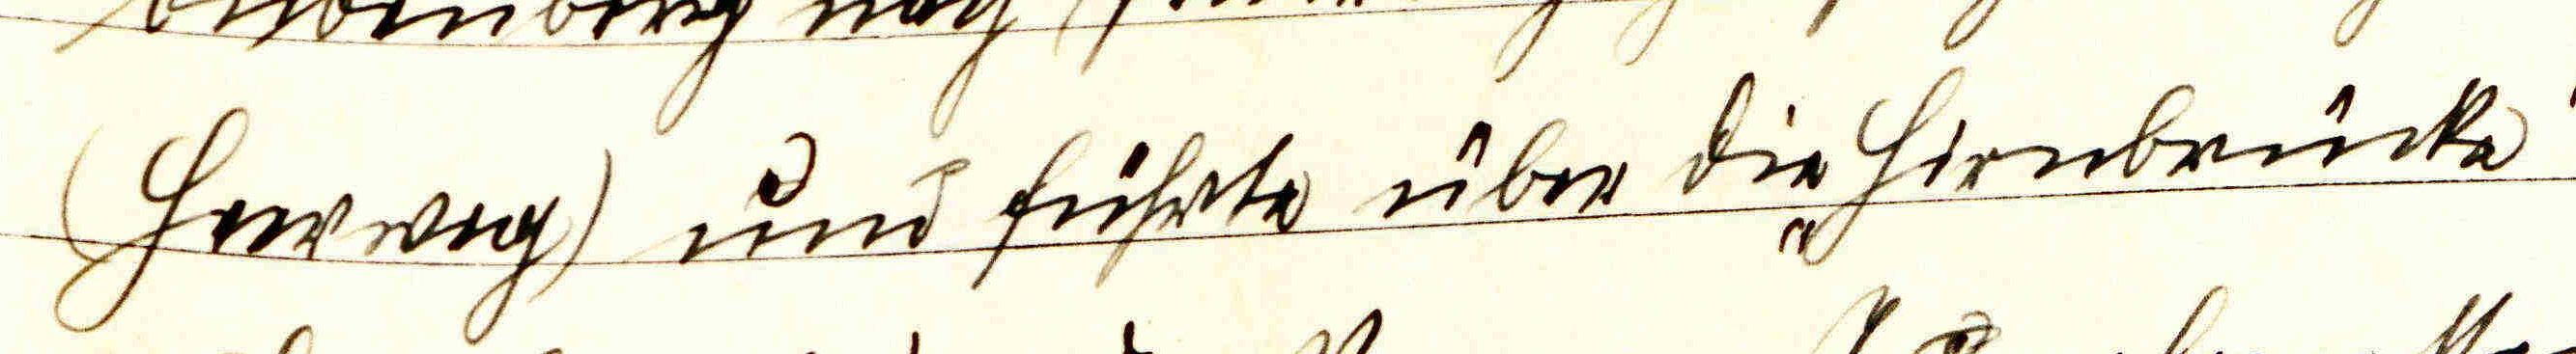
(Heerweg) und führte über die „Hirnbrücke“
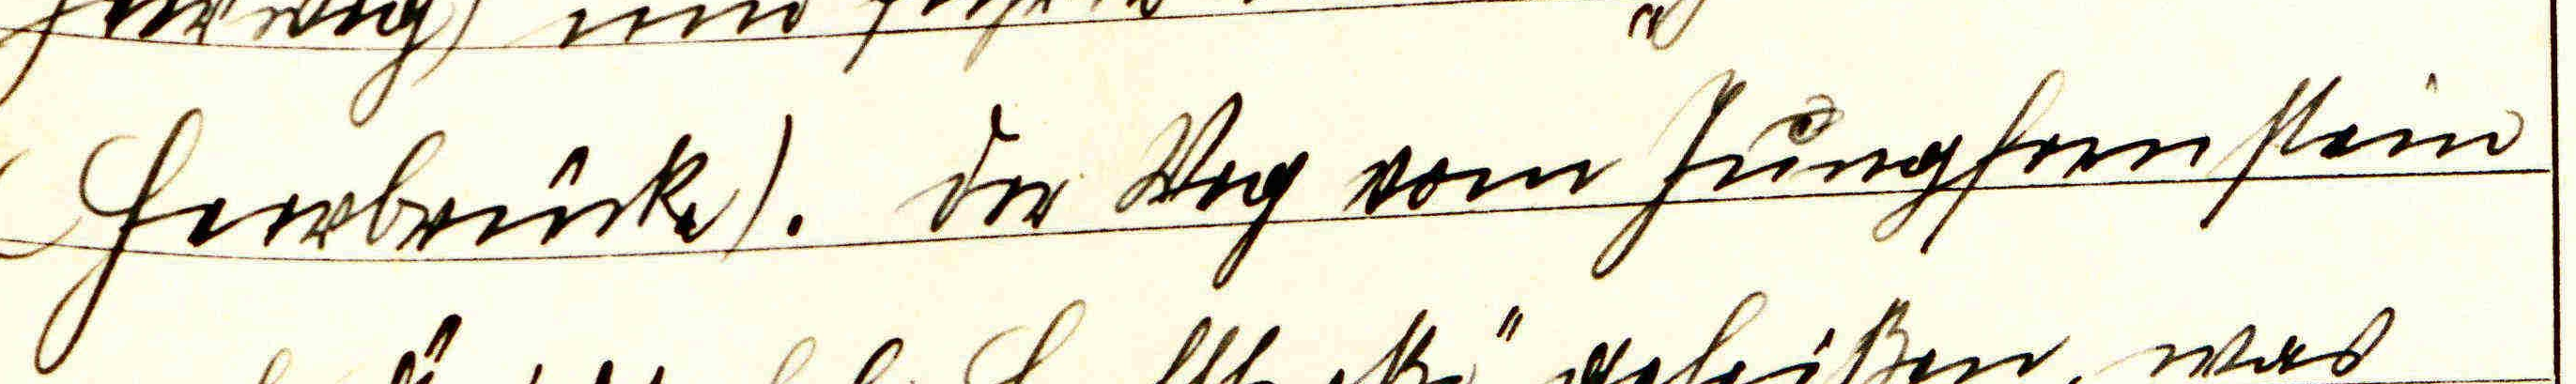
(Heerbrücke). Der Weg vom Jungfernstein
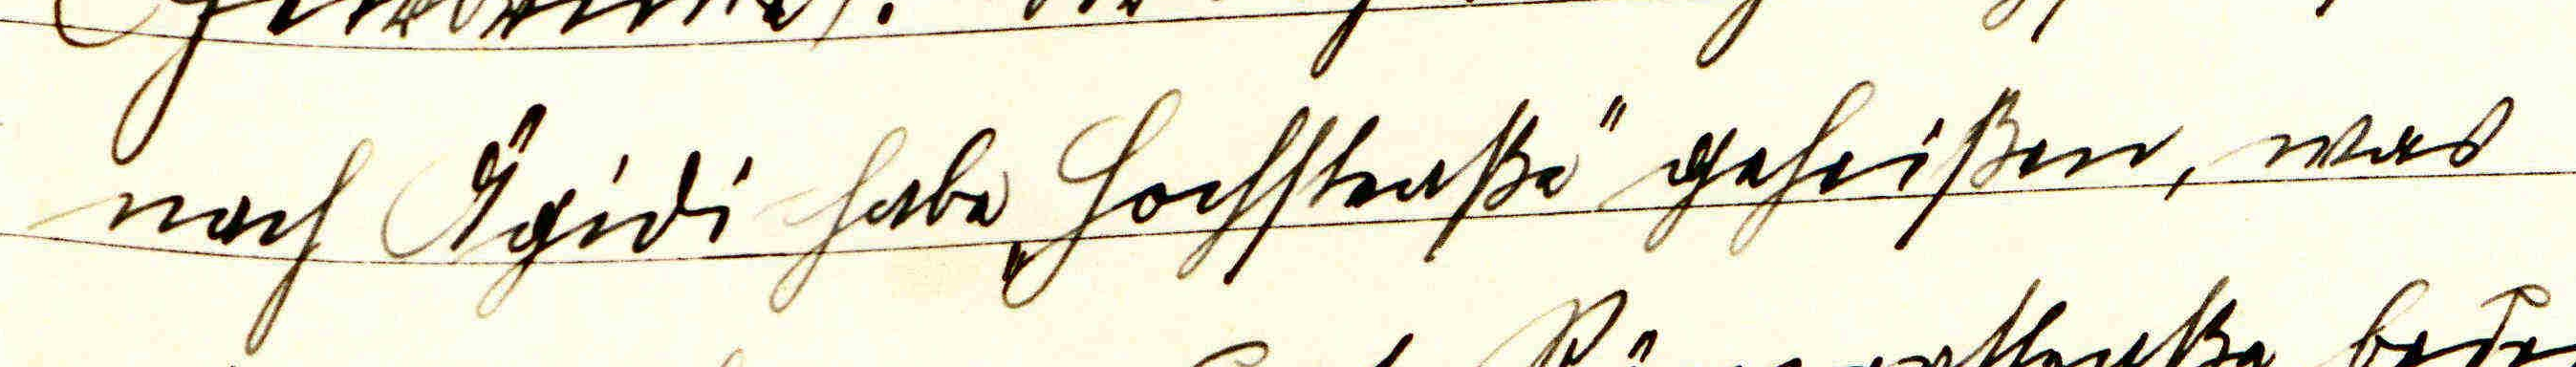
nach Ägidi habe „Hochstraße“ geheißen, was
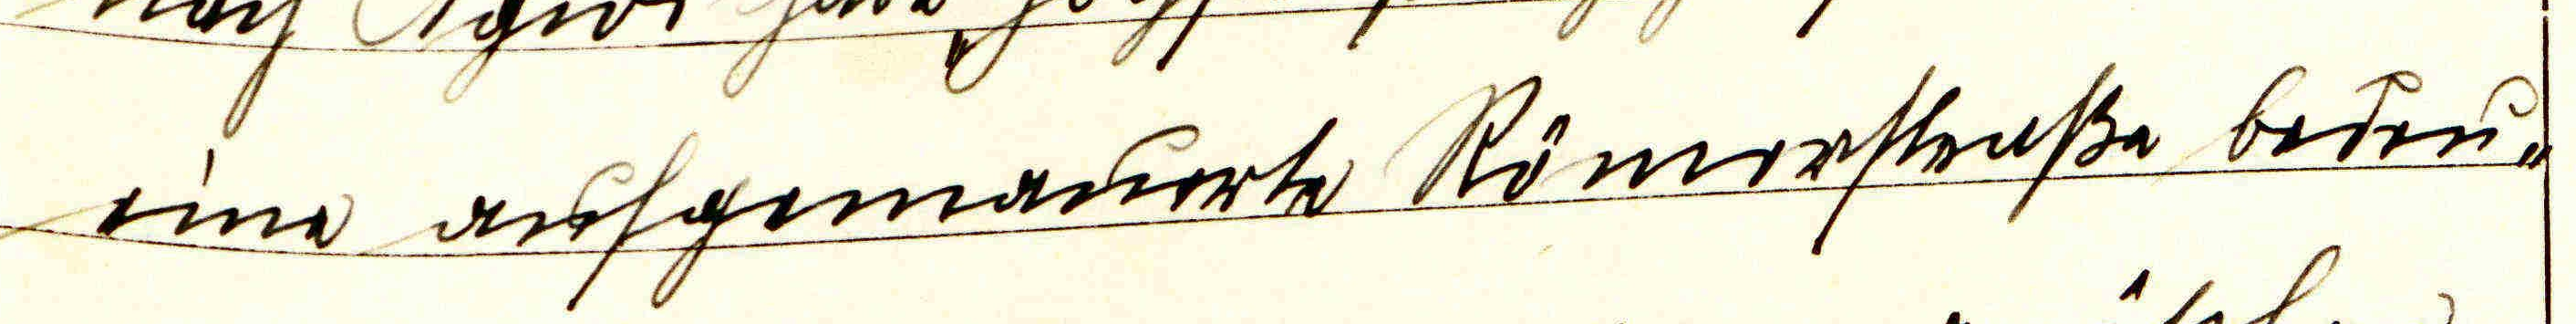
eine aufgemauerte Römerstraße bedeu-
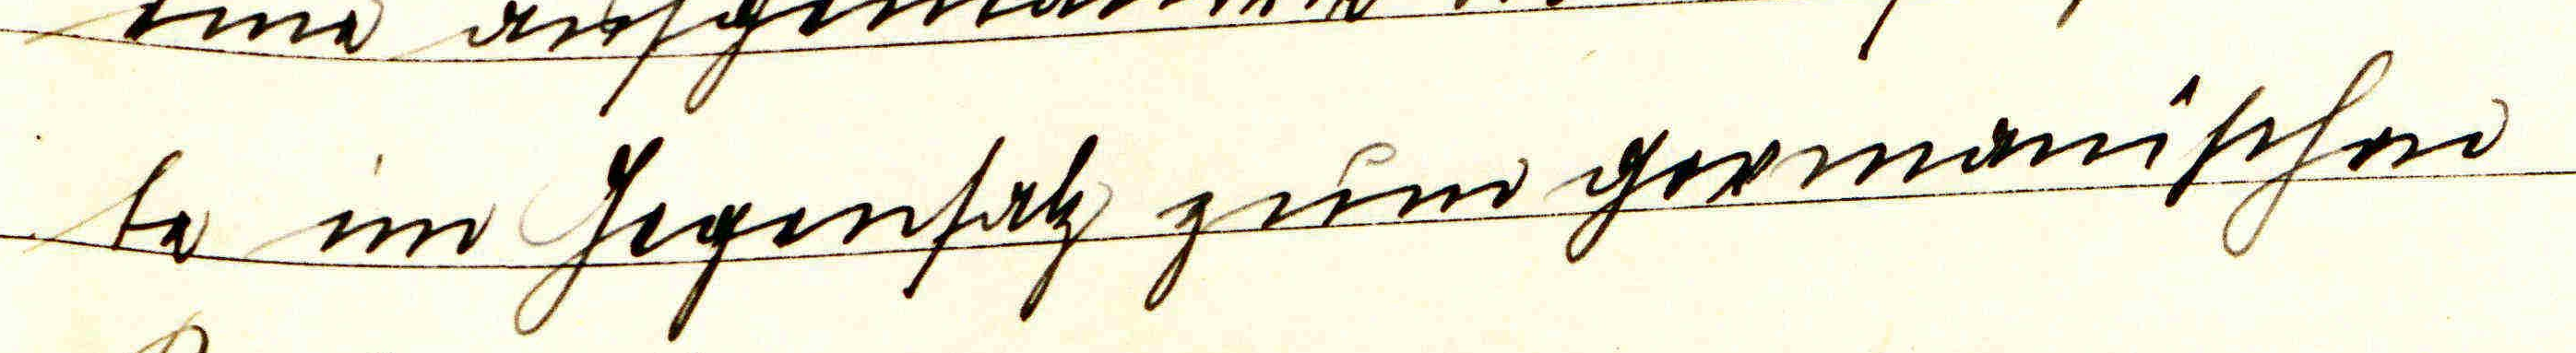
te im Gegensatz zum germanischen
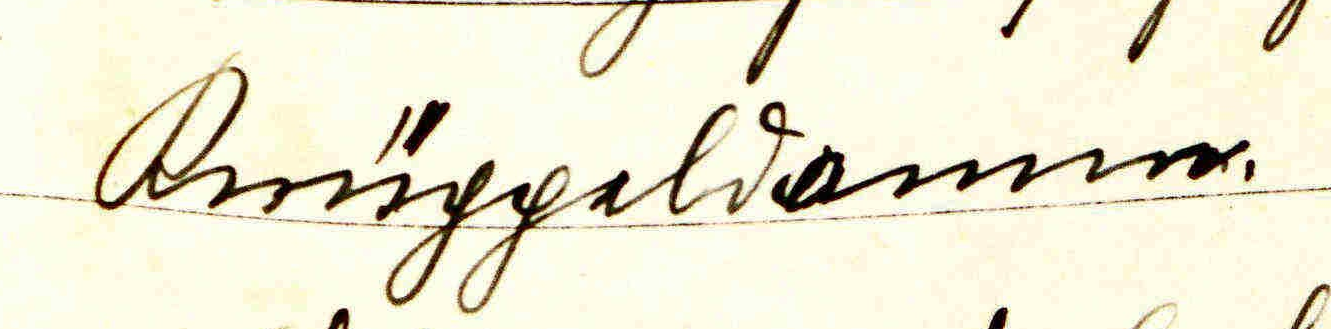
Knüppeldamm.
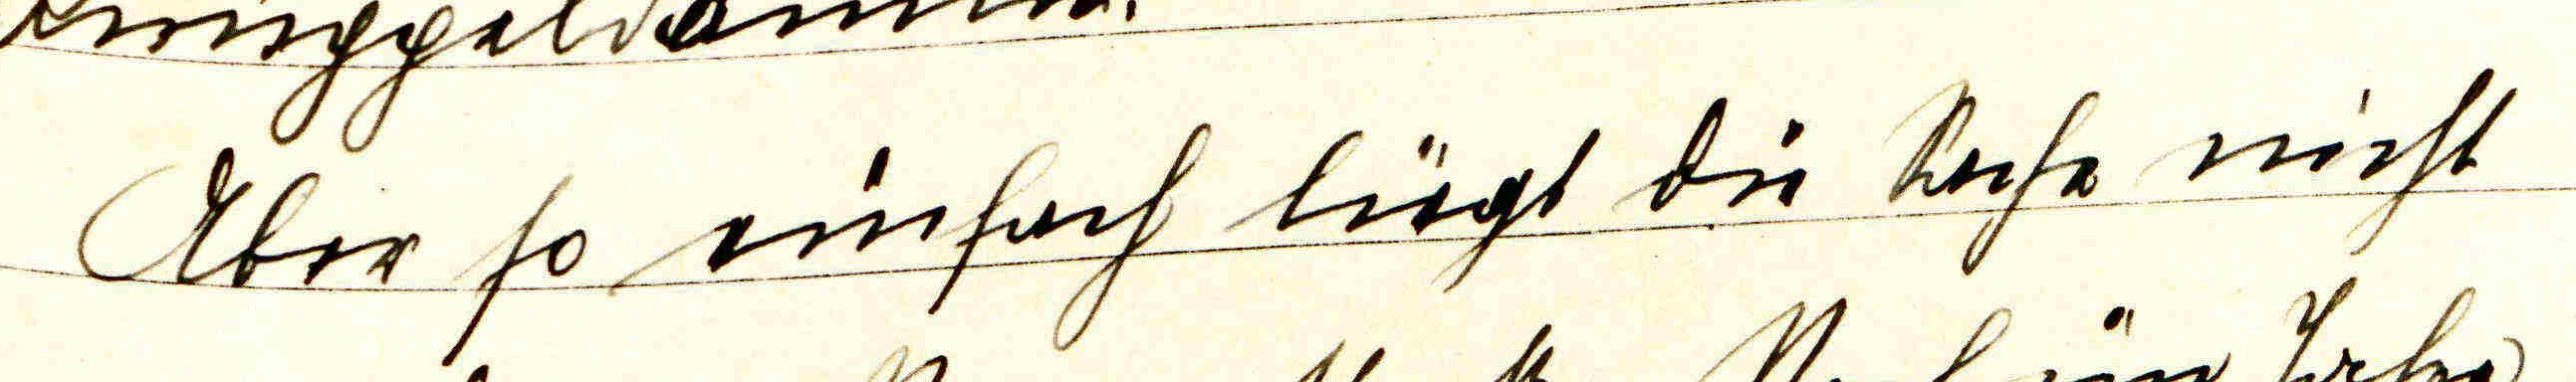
Aber so einfach liegt die Sache nicht
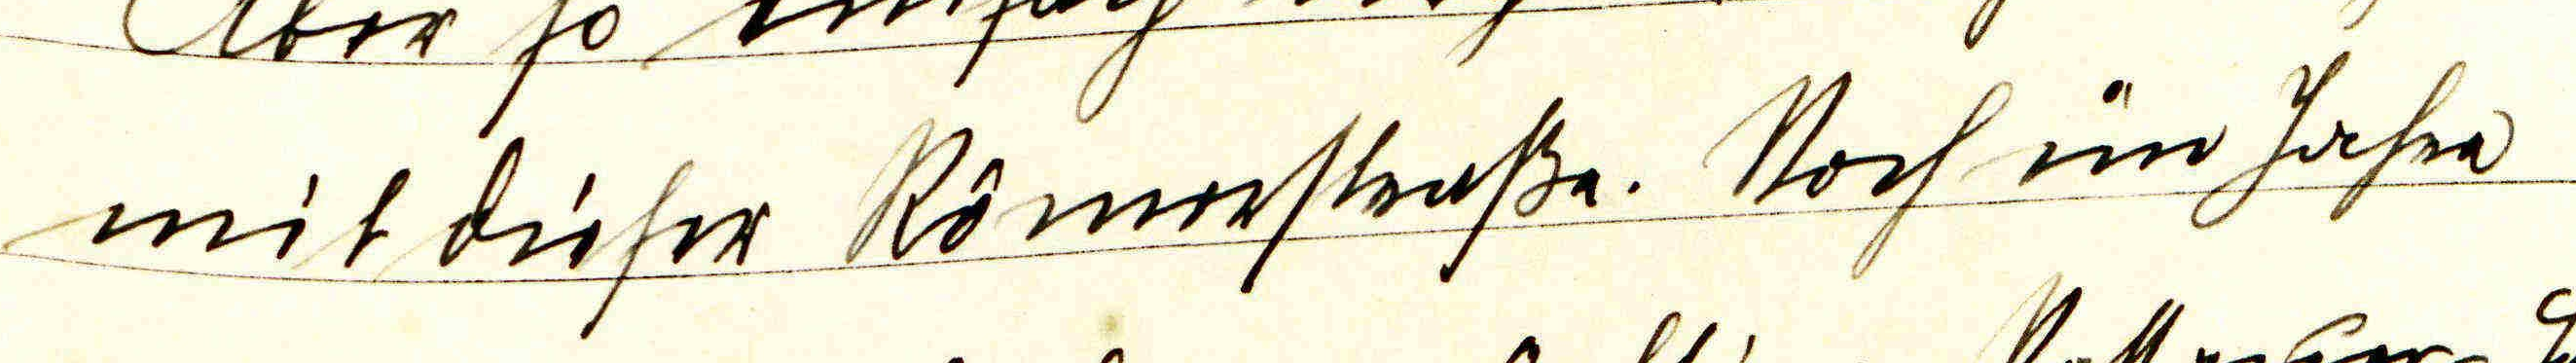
mit dieser Römerstraße. Noch im Jahre
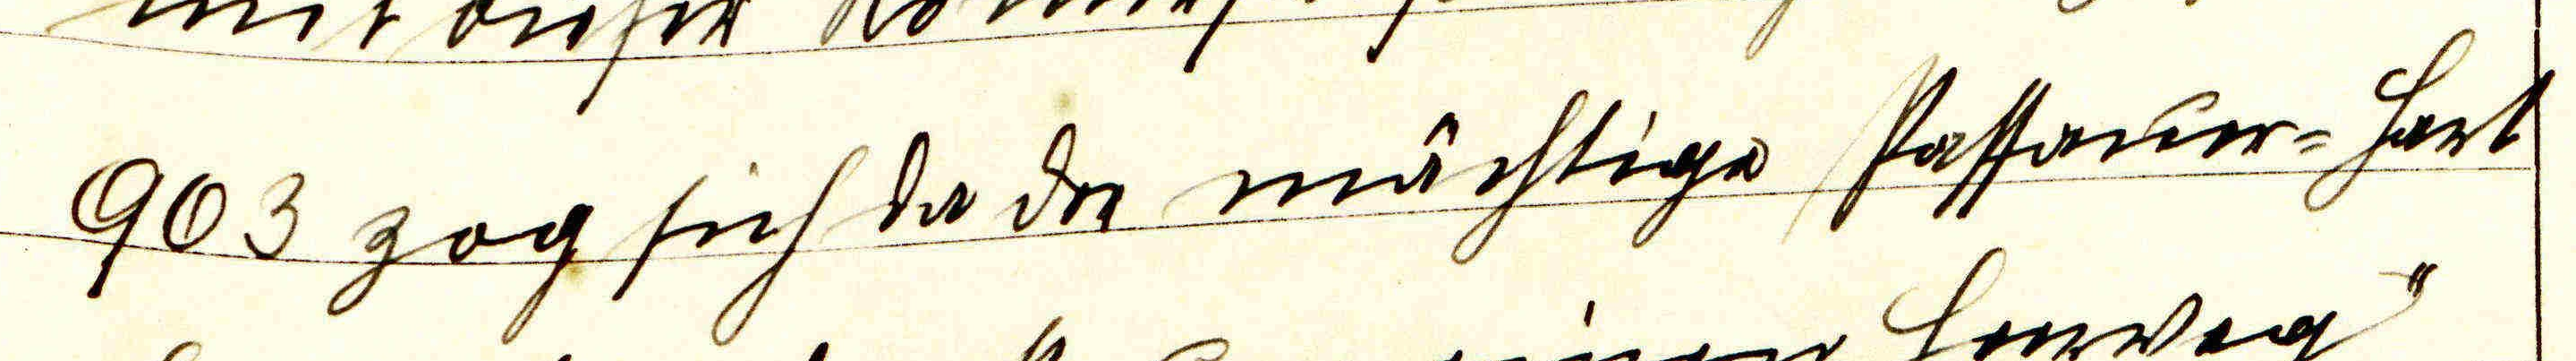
903 zog sich da der mächtige Passerer-Hart
